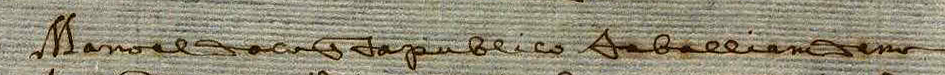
Manoel da costa publico taballiam de no
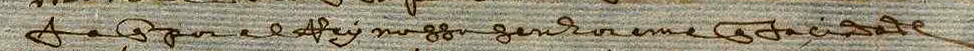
tas por el Rey nosso senhor em esta cidade
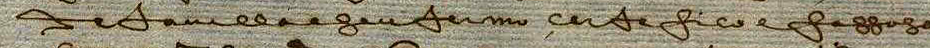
de tauilla e seu termo certifico e fasso sa
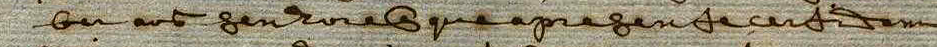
ber aos senhores que a presente certidam
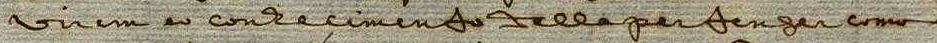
virem e o conhecimento della pertenser como
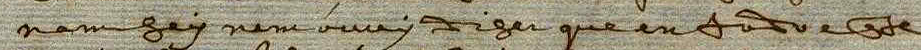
nam sey nem ouuy diser que en todo este
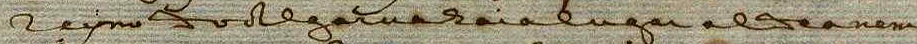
Reyno do Algarue haia lugar aldea nem
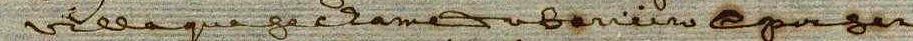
villa que se chame do barreiro e por ser
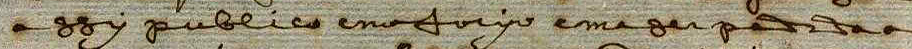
assy publico e notoryo e me ser pedida a
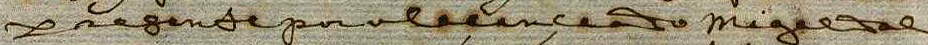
presente por o lecenceado migel dal
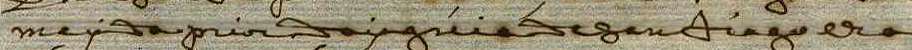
meyda prior da ygreia de santiago lha
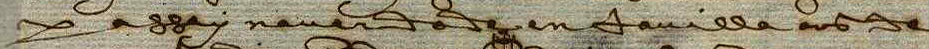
passey na uerdade en tauilla aos de
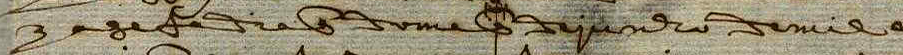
zasete dias do mes de junho de mil e
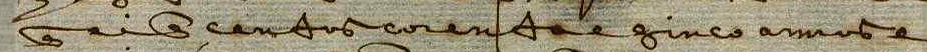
seiscentos corenta e sinco annos e
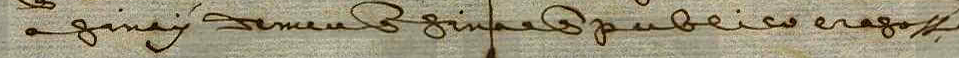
asiney de meus sinaes publico e raso //
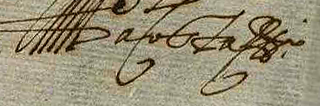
Mel a Costa
